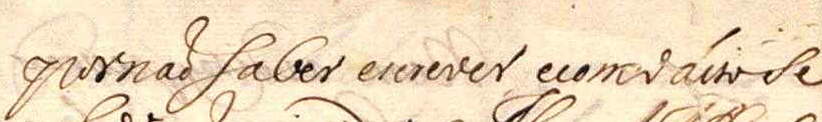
por naõ saber escrever, e com o dito se
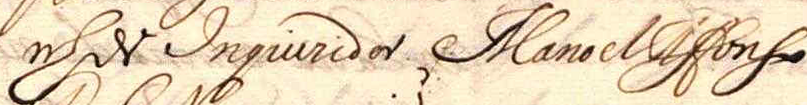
nhor Inquizidor Manoel Affonso
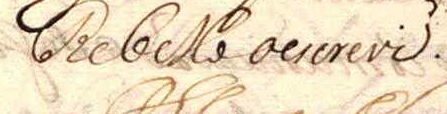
Rebello o escrevi.
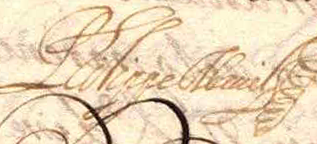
Philippe Maciel
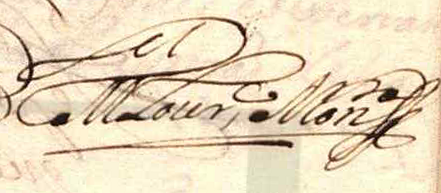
Mel Lourço Montro
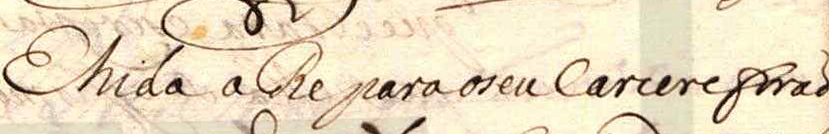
E hida a Re para o seu Carcere foraõ
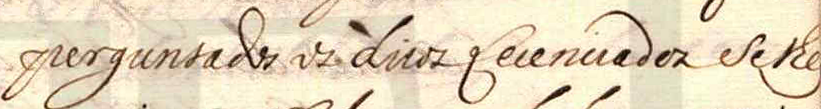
perguntados os ditos Lecenciadoz se lhe
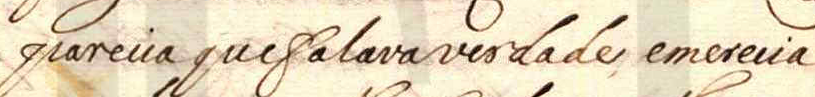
parecia que falava verdade, e merecia
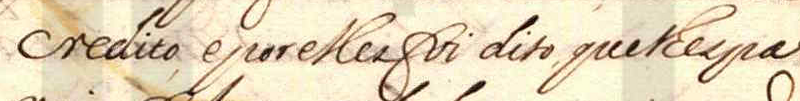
credito, e por elles foi dito que lhes pa
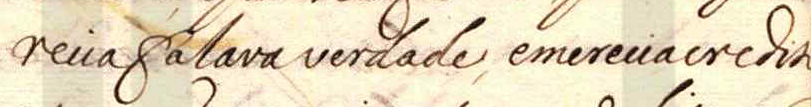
recia falava verdade, e merecia credito
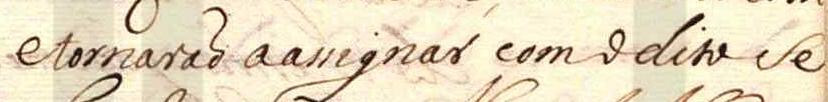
e tornaraõ a assignar com o dito Se
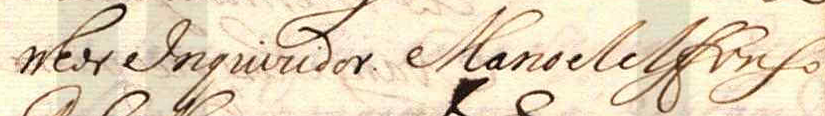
nhor Inquizidor Manoel Affonso
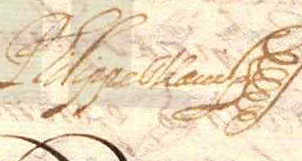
Philippe Maciel
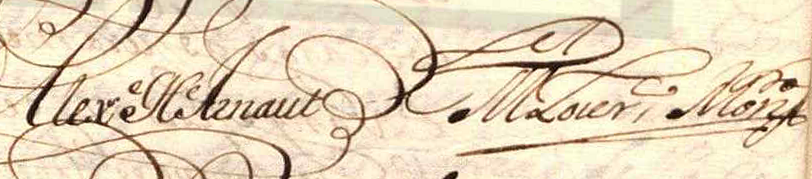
Alexe He Arnaut Mel Lourço Montro
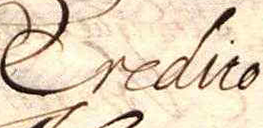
Credito
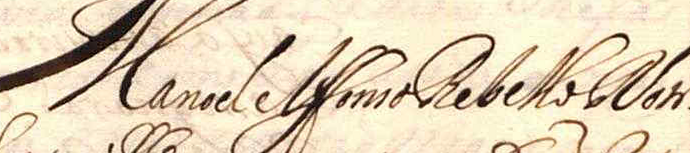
Manoel Affonso Rebello Notro
